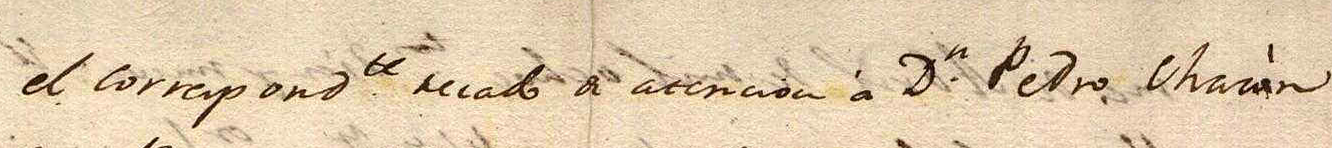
el correspond.te recado de atencion à D.n Pedro Chazón
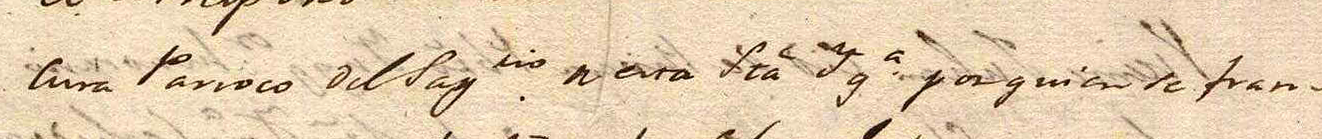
Cura Parroco del Sag.rio nesta Stā Yg.a por quien se fran
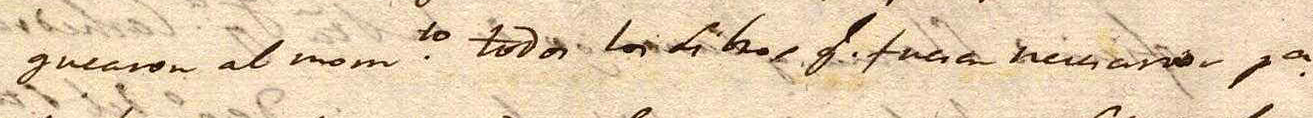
quearon al mom.to todos los Libros q.e fueran necesarios p.a
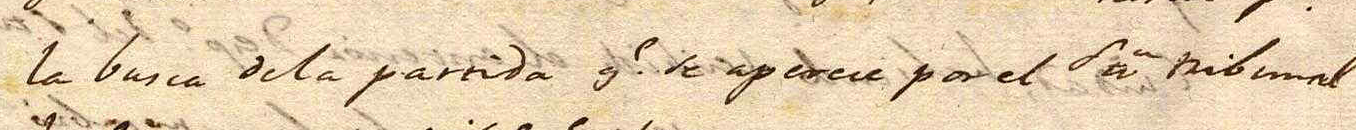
la busca dela partida q.e se apercie por el Stō tribunal
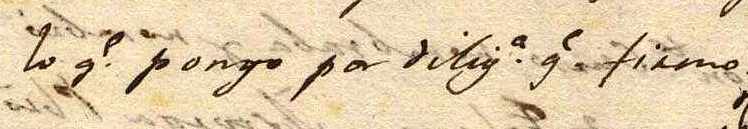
lo q.e pongo por dilig.a q.e firmo
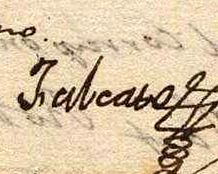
Falcato
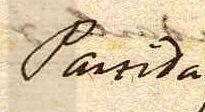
Partida
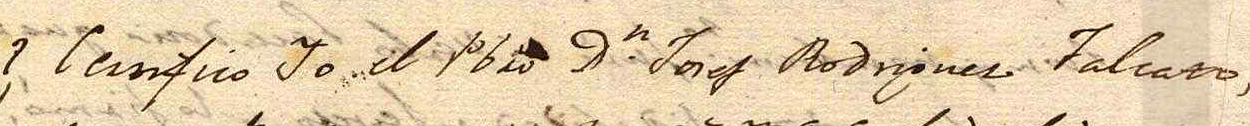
Certifico Yo el Pbrō D.n Iosef Rodriguez Falcato,
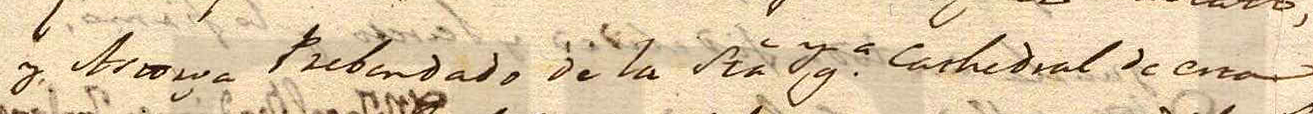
y Astorga Prebendado de la Stā Yg.a Cathedral de esta
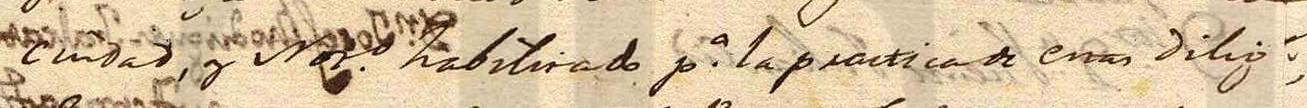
ciudad, y Not.o habilitado p.a la practica de estas dilig.s,
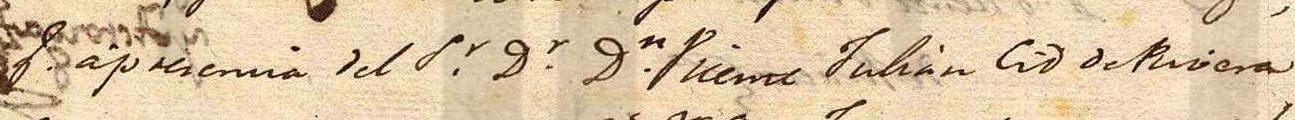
q.e a prezencia del S.r D.r D.n Vicente Iulian Cid de Rivera
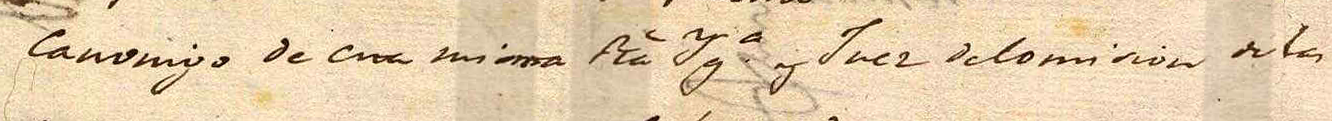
Canonigo de esta misma Stā Yg.a y Iuez de comision de las
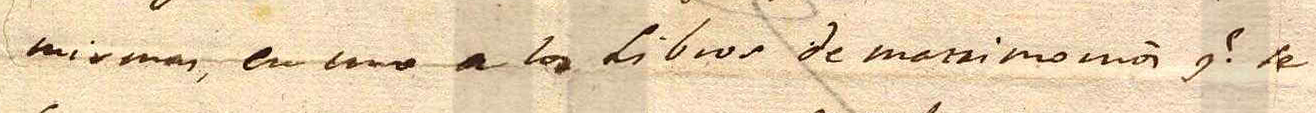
mismas, en como en los Libros de matrimonios q.e se
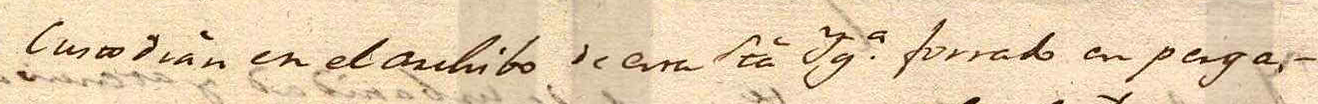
Custodian en el archibo de esta Stā Yg.a forrado en perga
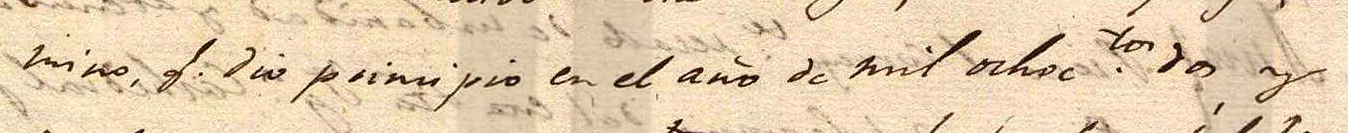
mino, qe. dio principio en el año de mil ochoc.tos dos, y
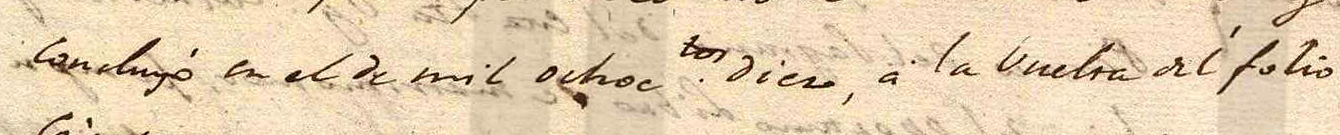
concluyó en el de mil ochoc.tos diez, a la vuelta del folio
